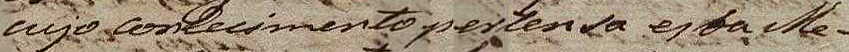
cujo conhecimento pertensa esta Me
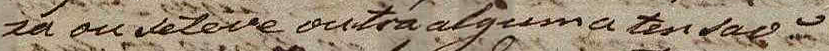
za ou se teve outra alguma tensaõ
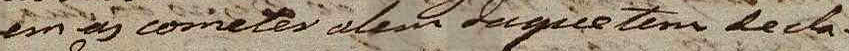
em as cometer alem da que tem decla
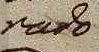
rado
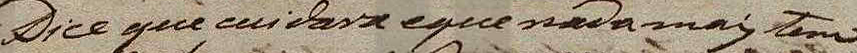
Dice que cuidara e que nada mais tem
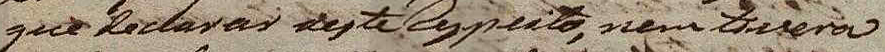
que declarar neste Respeito, nem tivera
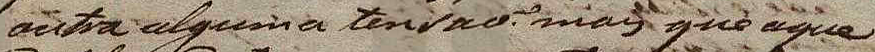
outra alguma tensaõ mais que o que
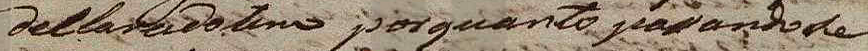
declarado tem porquanto pasando se
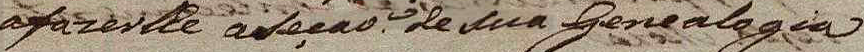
a fazer lhe a seçaõ de sua Genealogia
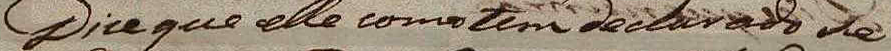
Dice que elle como tem declarado se
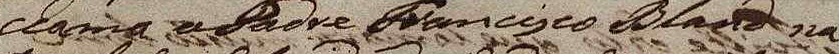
chama o Padre Francisco Bland na
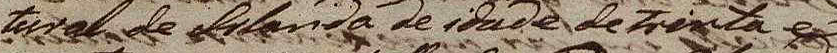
tural de Irlanda de idade de trinha e
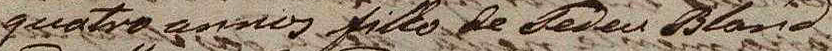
quatro annos filho de Tedeu Bland
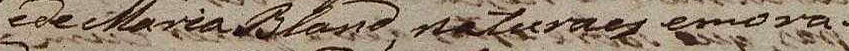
e de Maria Bland, naturaes e mora
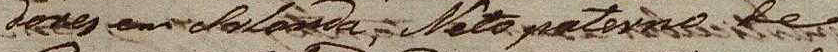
dores em Irlanda, Neto paterno de
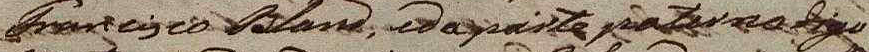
Francisco Bland, e da parte paterna digo
